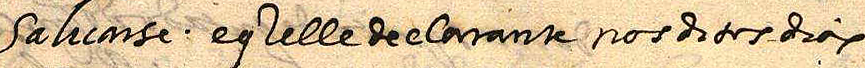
Saluarse. e que elle declarante nos ditos dias
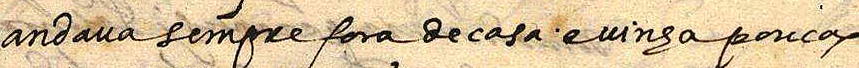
andaua sempre fora de casa e uinha poucas
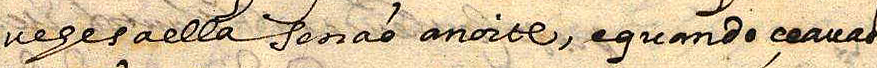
uezes a ella senaõ a noite, e quando ceauaõ
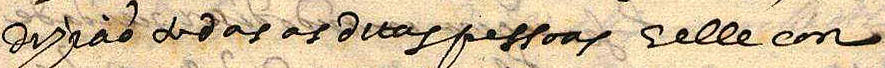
diziaõ todas as ditas pessoas E elle con
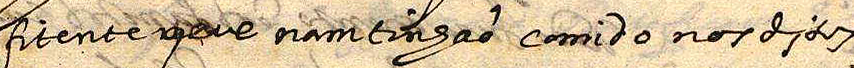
fitente que nam tinhaõ comido nos djtos
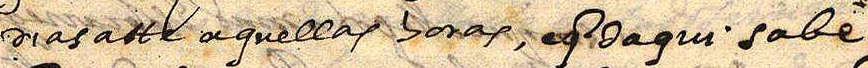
dias atte aquellas horas, e q̄ daqui sabe
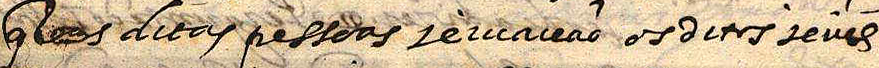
q̄ as ditas pessoas jeiuauaõ os ditos jeiūs
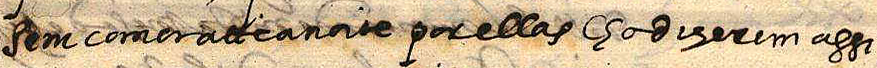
sem comer atte a noite por ellas lhe dizerem assi
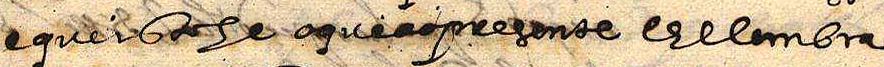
e que isto he o que ao presente lhe lembra
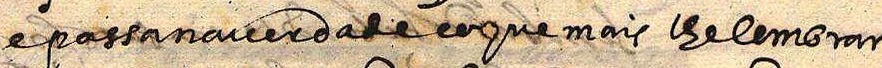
e passa na uerdade e o que mais lhe lembrar
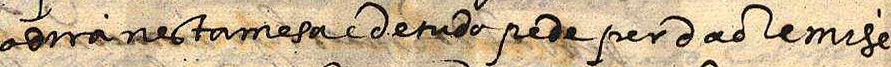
o dira nesta mesa e de tudo pede perdaõ e mise
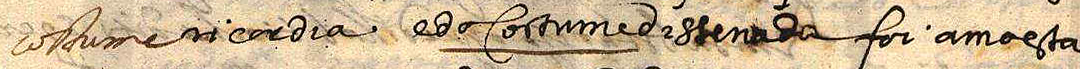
ricordia e do Costume disse nada foi amoesta
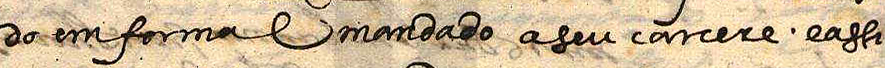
da em forma e mandado a seu carcere e assi
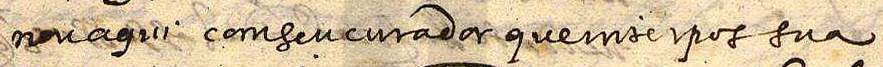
nou aqui com seu curador que interpos sua
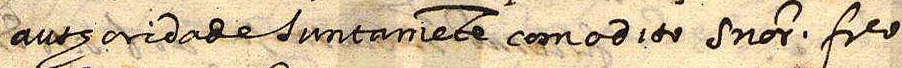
authoridade Iuntamēte com o dito Snōr frco
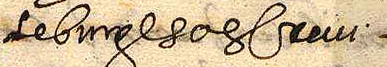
de burges o esCreui
